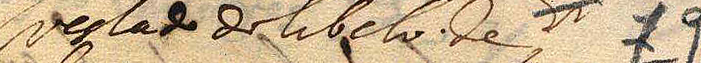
Treslado do libelo de
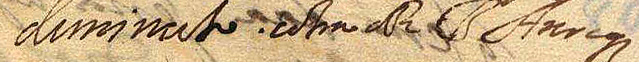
diminuto cōtra o R. Bto Anriqz
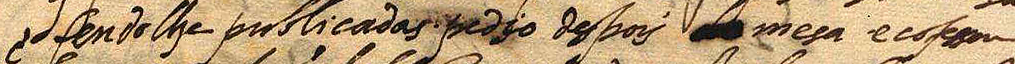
e sendo lhe publicadas pedio despois _ mesa e cōfessou
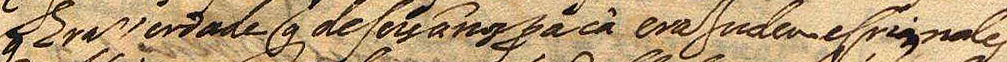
q̄ Era verdade q̄ se seis an̄os ꝑa ca era Judeu e Cria na lej
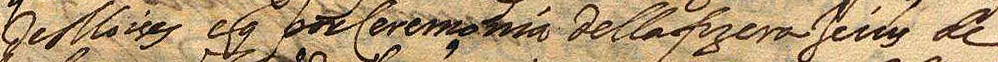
de Moises e q̄ por Ceremonia della fizera Jeiūs de
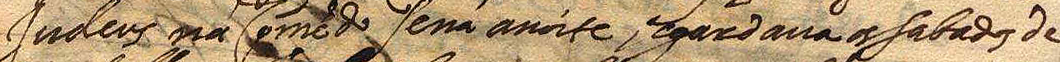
Judeus nā Comēdo senā a noite, e gardaua os sabados de
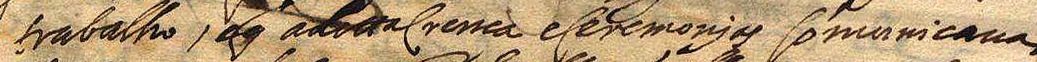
trabalho, o q̄ a ditta Crença e Ceremonias Comunicaua
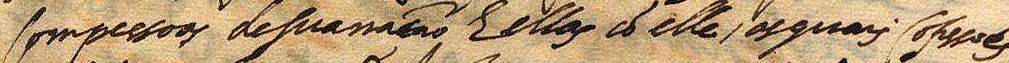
Com pessoas de sua nação E ellas cō elle, as quais Cōfissoẽs
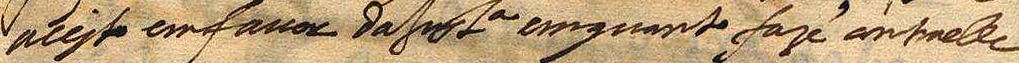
acejto em fauor da Justa emquanto fazē contra elle
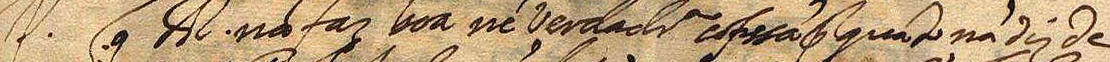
P. q̄ o R. naõ faz boa nē verdadra cōfissā p̄quāto nā diz de
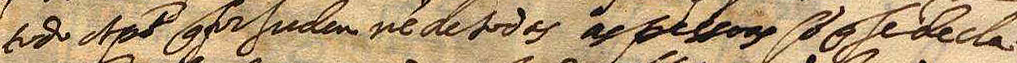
todo o tpō q̄ foi Judeu nē de todas as pessoas Cō q̄ se decla
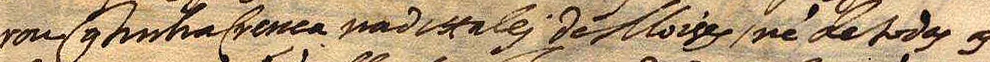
rou q̄ tinha Crença na ditta lej de Moises, nē de todas as
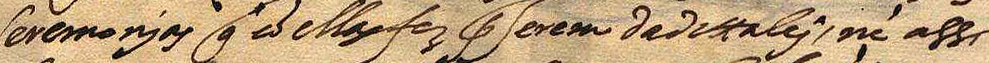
Ceremonias q̄ cō ellas fez ꝑ serem da ditta lej, nē assi
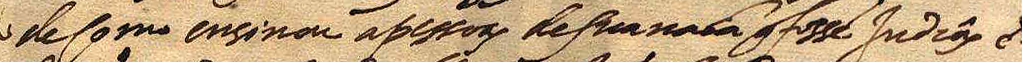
de Como ensinou a pessoas de sua naçā q̄ fossē Judias e
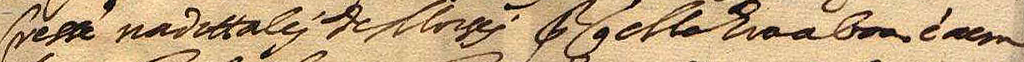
Cressē na ditta lej de Moises p̄ q̄ ella Era a boa e a em
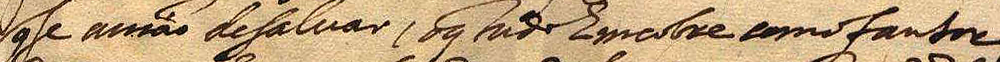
q̄ se auiaõ de saluar, o q̄ tudo Emcobre como fautor
